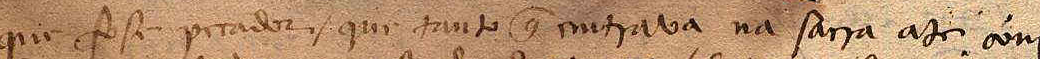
que fose pecador / que tanto q̄ emtrava na sacra ate com
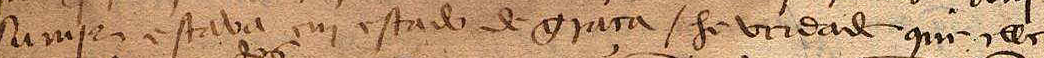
sumjr estava em estado de graça / he verdade que elle
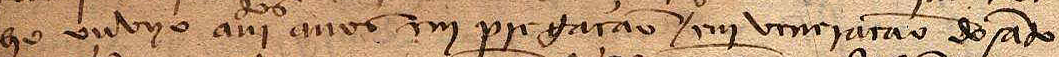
ho ouvyo a mtos anos em pregação / em veneração do s̄ato
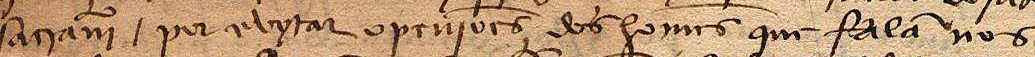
sacramto / por evytar openjões dos hom̄es que falā nos
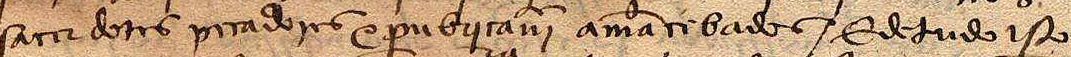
sacerdotes pecadores e pubrjcamte am̄açebados / E de tudo isto
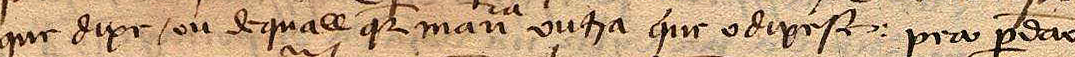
que dixe / ou de quallq̄r manra outra que o dixese : peco ꝑdão
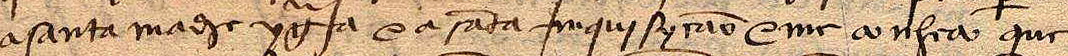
a santa madre yḡJa e a s̄ata Jmqujsycão e me conheco que
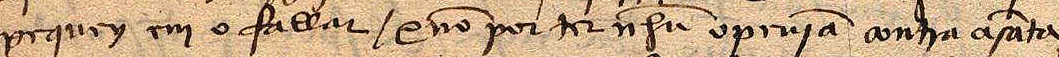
pequey em o fallar / e n̄o por ter nhū openj̄a contra a s̄ata
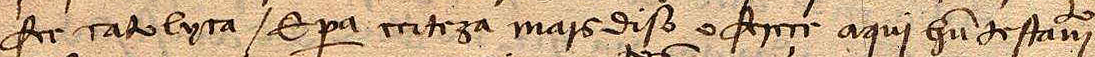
fee catolyca / E ꝑa certeza majs diso ofereçe aquj hū testamto
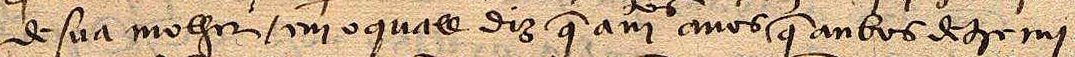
de sua molher / em o quall diz q̄ a mtos anos q̄ anbos detremj
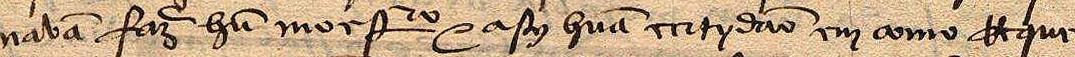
navā fazē hū moestro e asy huā certydão em como Reque
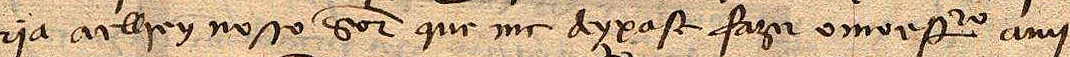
rja a ell rey nosso S̄or que me deyxase fazer o moestro a mj
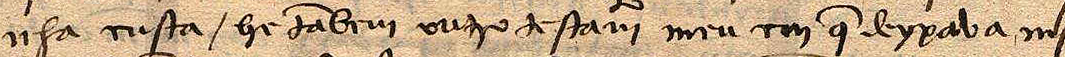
nha custa / he t̄abem outro testamto meu em q̄ deyxava mj
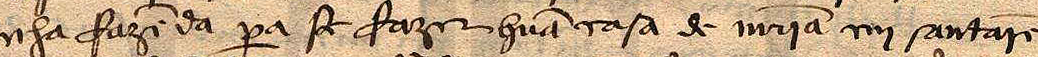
nha fazēda ꝑa se fazer huā casa de mr̄ja em santāre
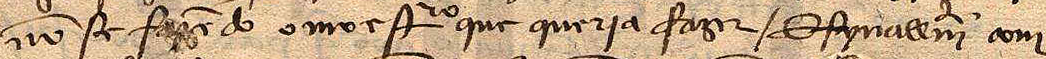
n̄o se fazēdo o moestro que querja fazer / E fynallmte com
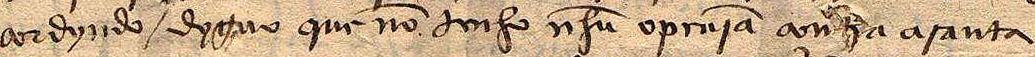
cordyndo / dyguo que n̄o tenho nhū open̄ja contra a santa
